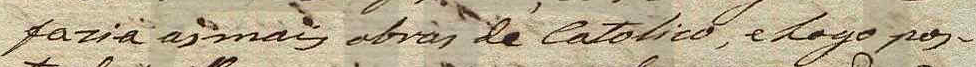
fazia as mais obras de Catolico, e Logo pos
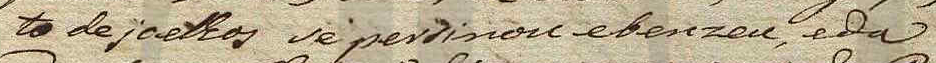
to de joelhos se persinou e benzeu, e da
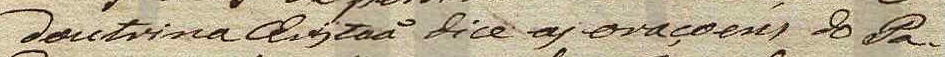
doutrina christaã dice as oraçoens do Pa
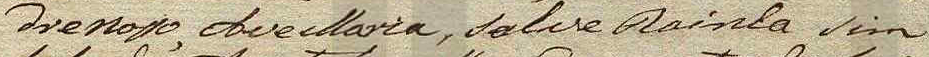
dre nosso, Ave Maria, salve Rainha sim
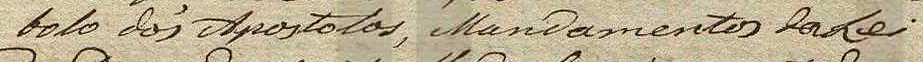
bolo dos Apostolos, Mandamentos da Lei
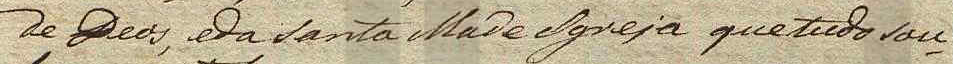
de Deos, e da santa Made Igreja que tudo sou
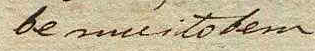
be muito bem
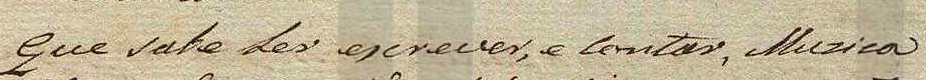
Que sabe ler escrever, e contar, Muzica
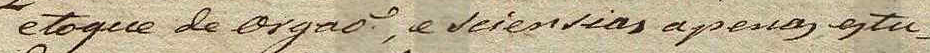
e toque de orgaõ, e sciensias apenas estu
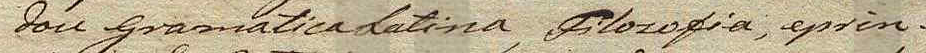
dou Gramatica Latina, Filozofia, e prin
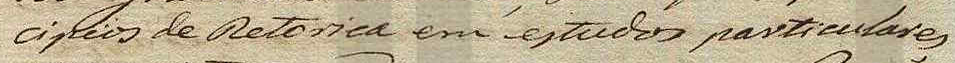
cipios de Retorica em estudos particulares
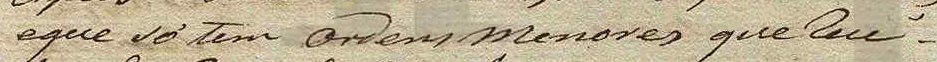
e que só tem ordens menores que Rece
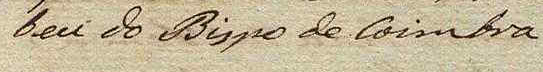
beu do Bispo de Coimbra
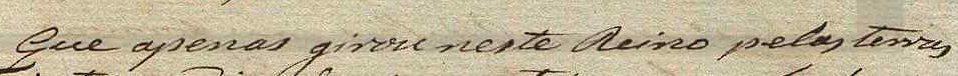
Que apenas girou neste Reino pelas terras
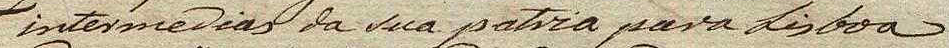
intermedias da sua patria para Lisboa
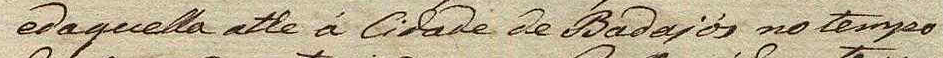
e daquella athe á Cidade de Badajós no tempo
